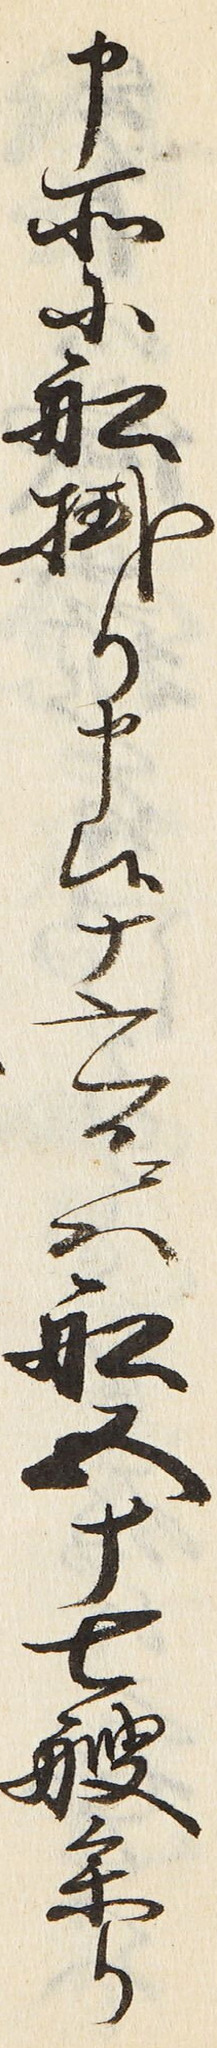申所に船掛り申候十六日ニハ船五十七艘余り
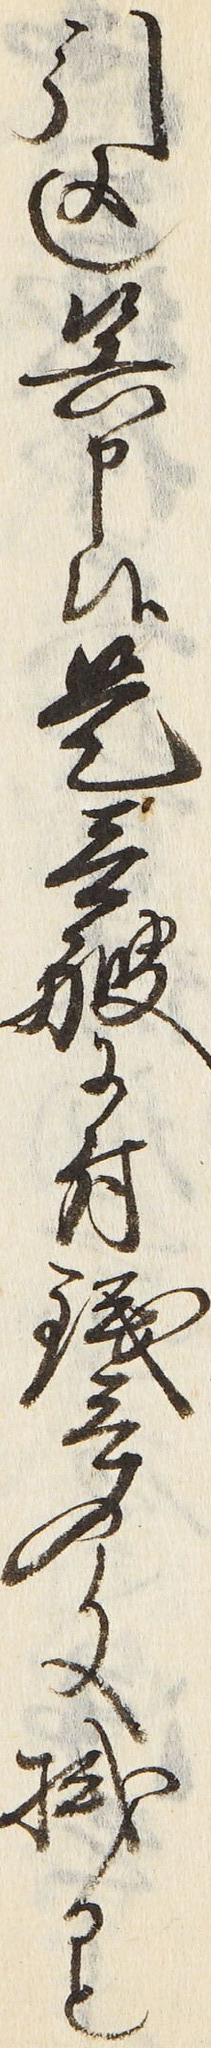引込呉申候是壱艘に付銭三貫文掛ると
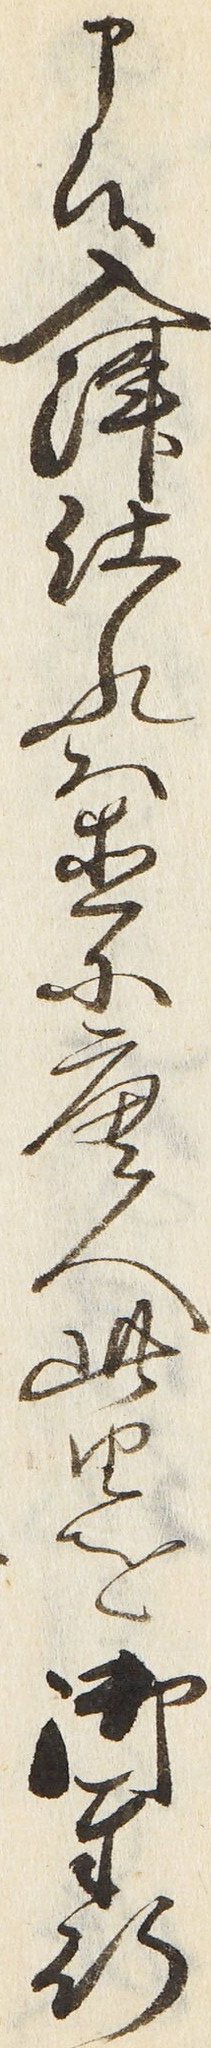申候入津仕れハ直に唐人此由を御奉行
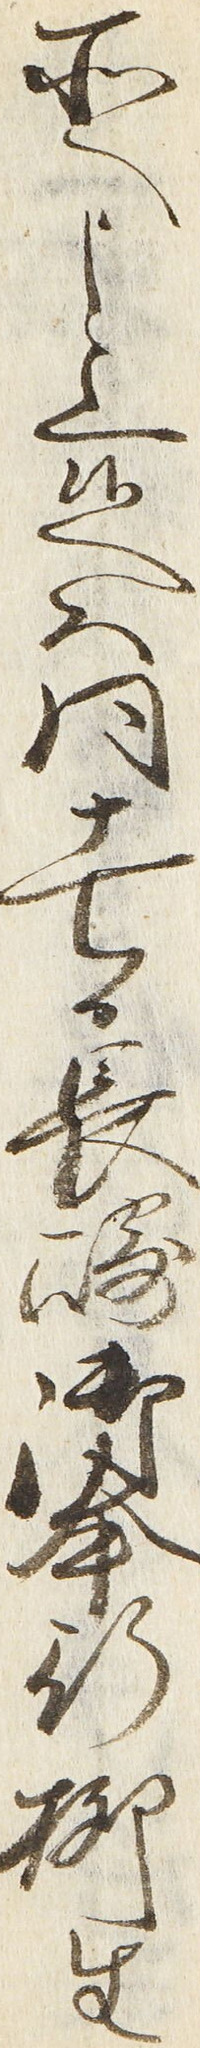所へ申上候へハ同十七日長崎御奉行柳生
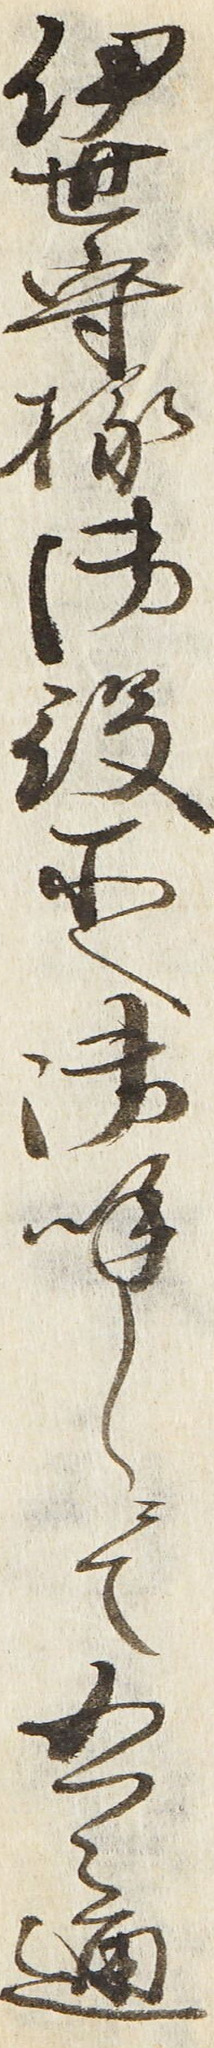伊世守様御役所へ御呼しニて有之通
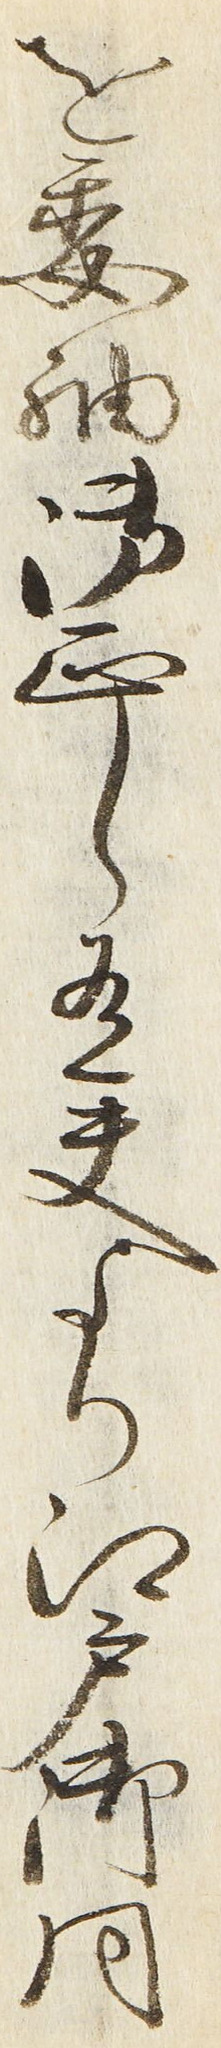を委細御正し有夫より江戸御同
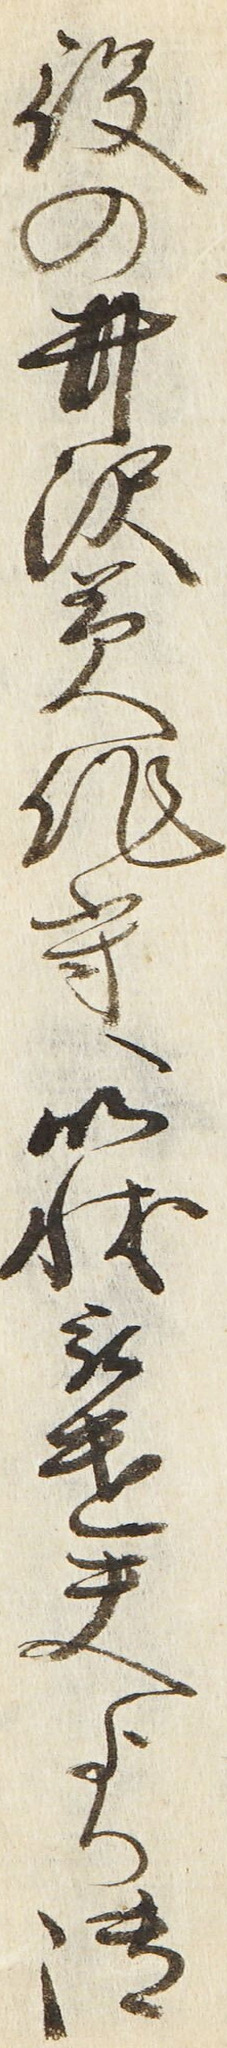役の井沢美作守へ御状被遣夫より御
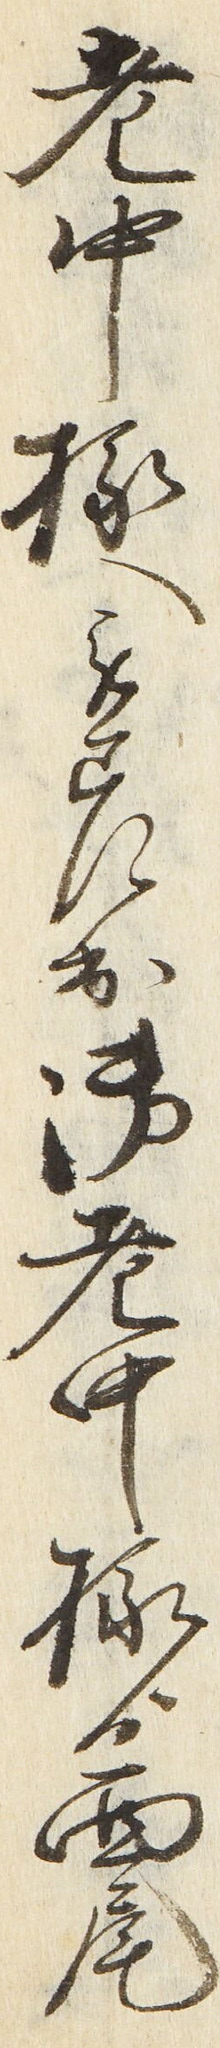老中様へ被差出御老中様ゟ西尾

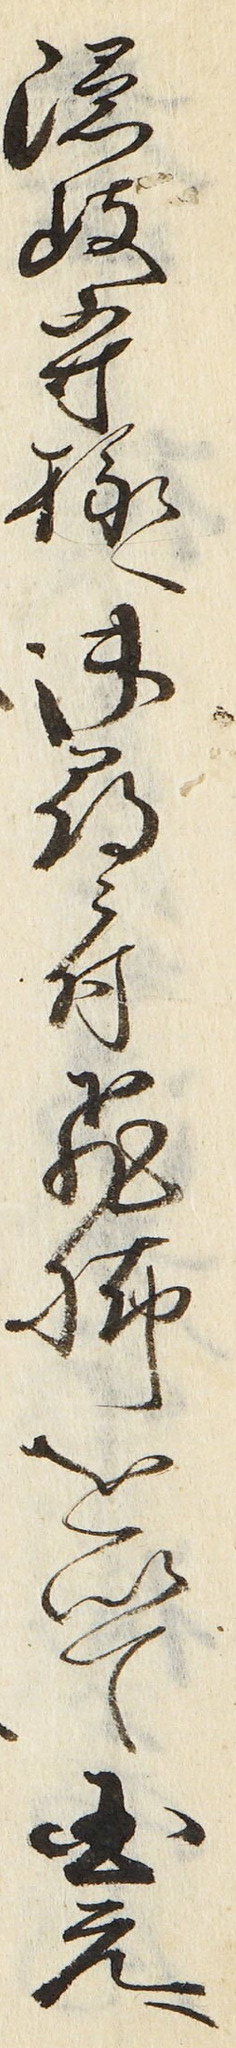隠岐守様へ御尋ニ付飛脚を以て国元へ
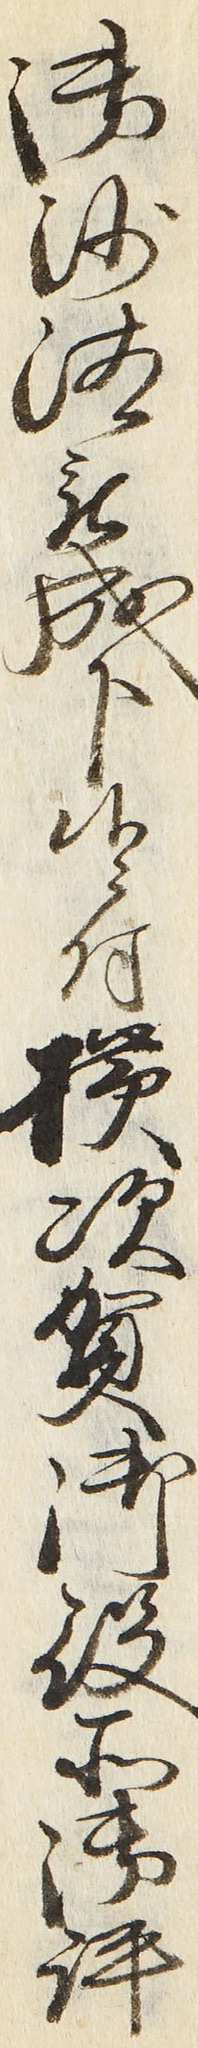御沙汰被成下候ニ付横須賀御役所御評
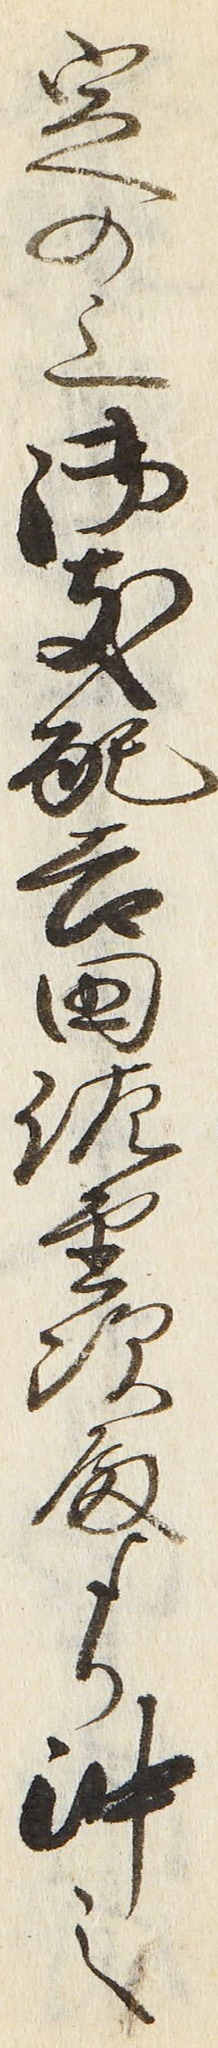定の上御支配吉田佐重次殿より沖之
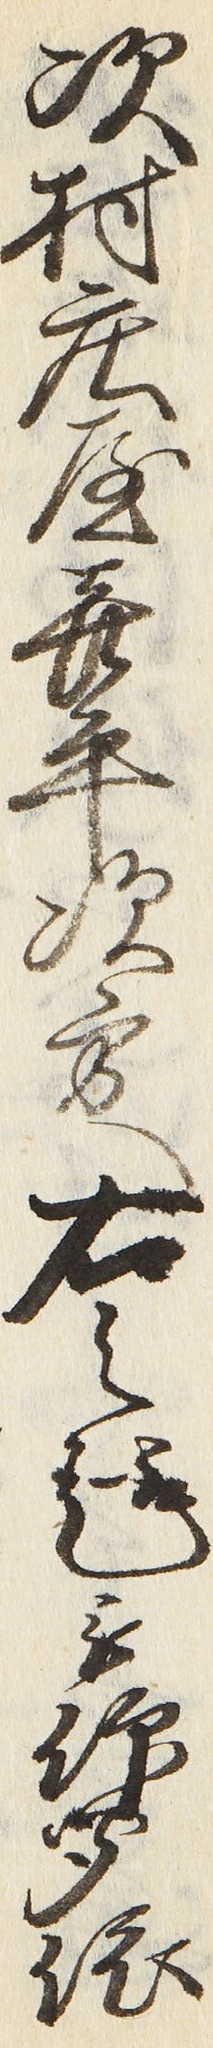次村庄屋喜平治方へ右之趣披仰聞依
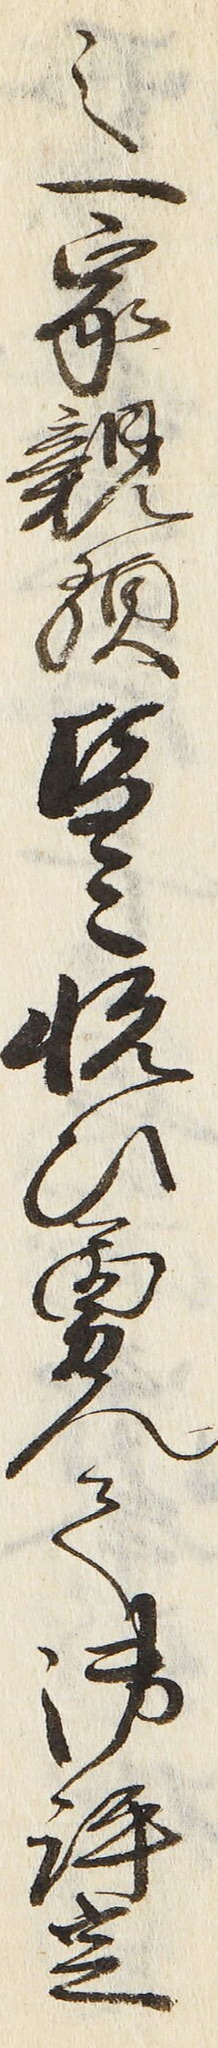之一家親類皆々悦ひ勇んて御評定
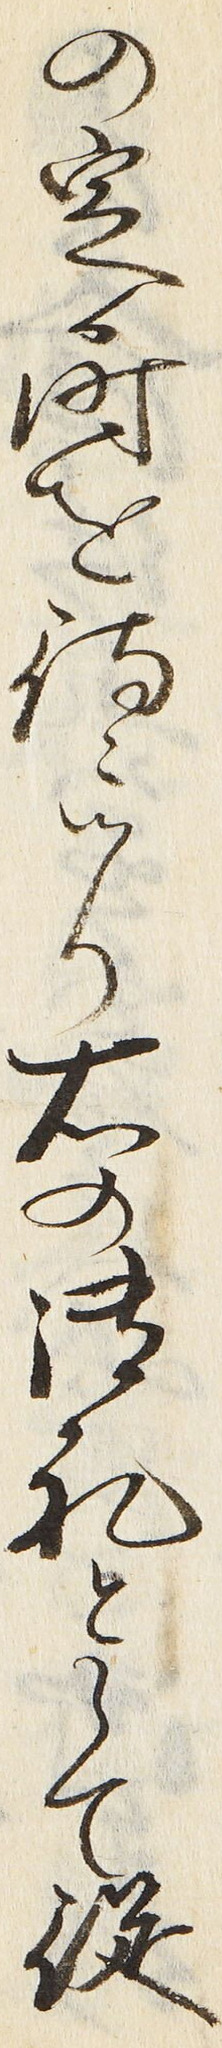の定る時を待ニ候り右の御礼として従
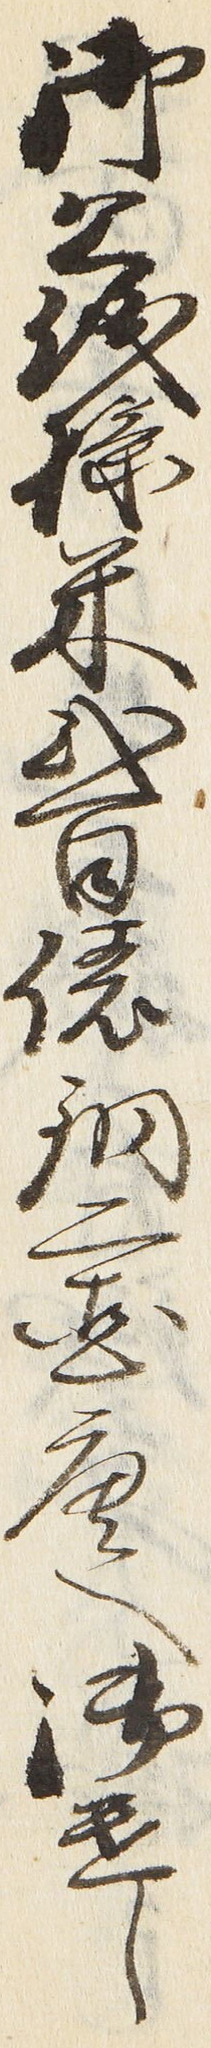御公儀様米弐百俵銅二函唐へ御遣し
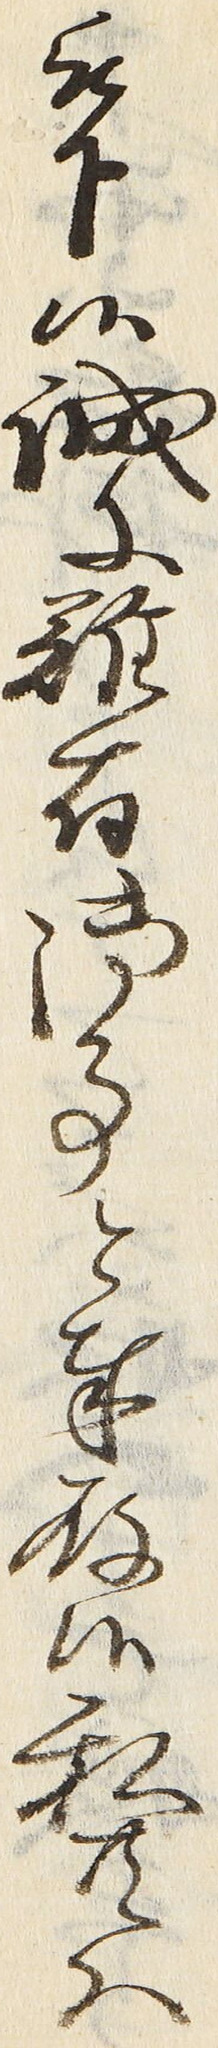被下御誠に難有御事と奉存候私共ハ
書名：天保漂流記
